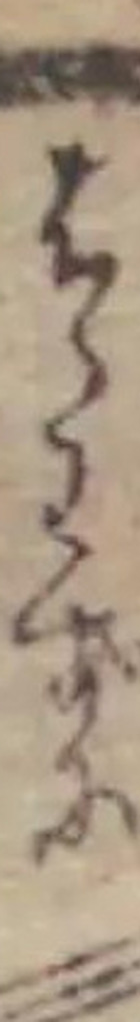はらわずに
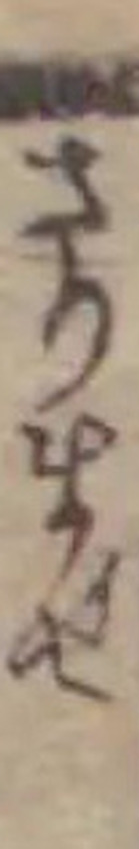さりませ
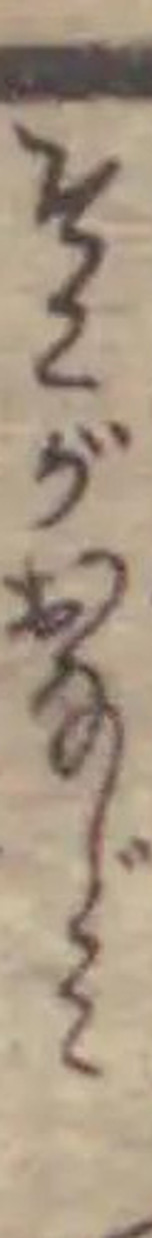そこがおなじみ
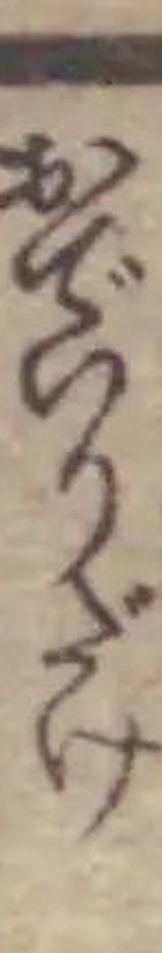おでいりだけ
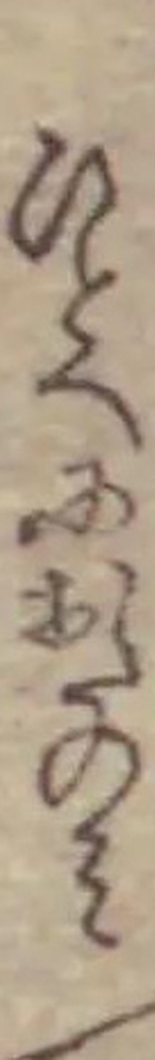ひとへにおたのみ
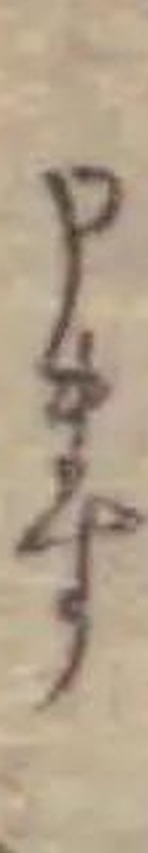申ます
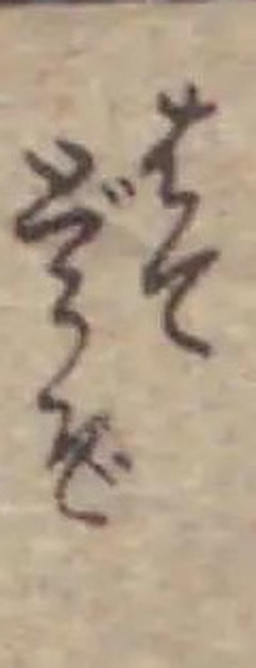どうぞ
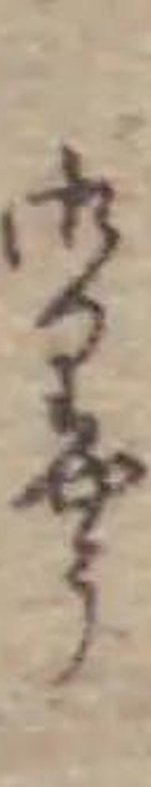御りやう
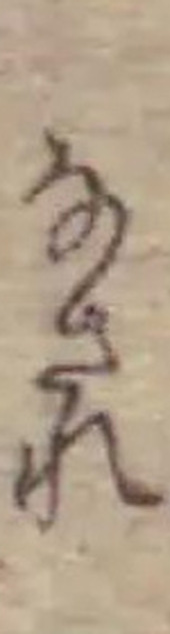なされ

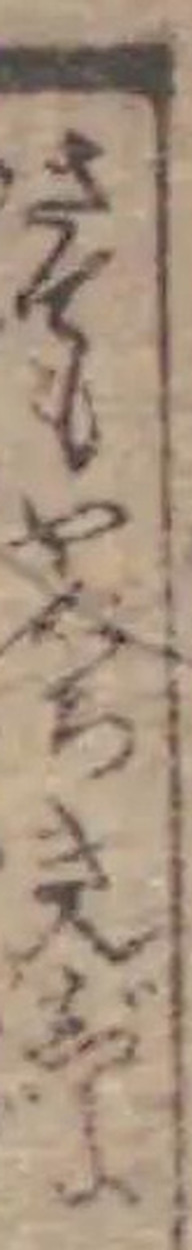さてもやぐちきんじよ
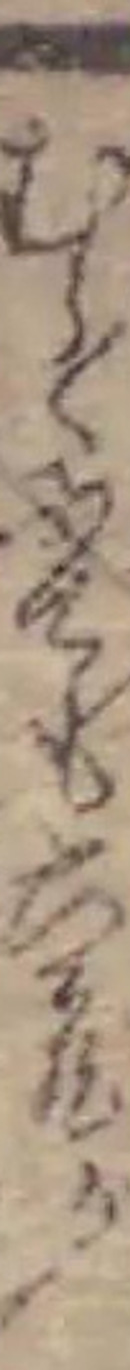むら〳〵にても六蔵が
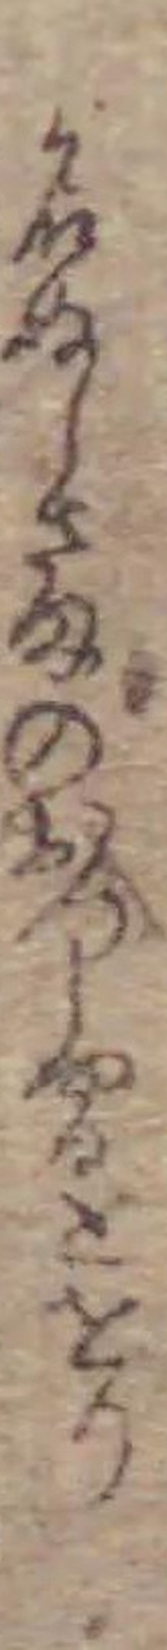名ぬしさまのおつしやるとをり
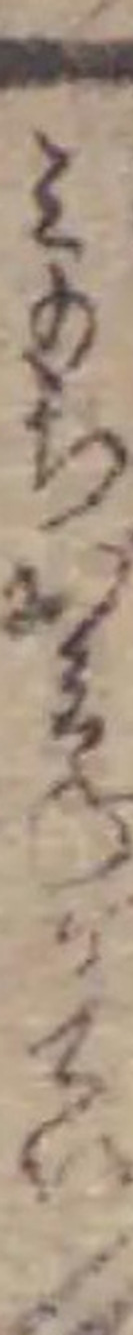みもちおみねがてい
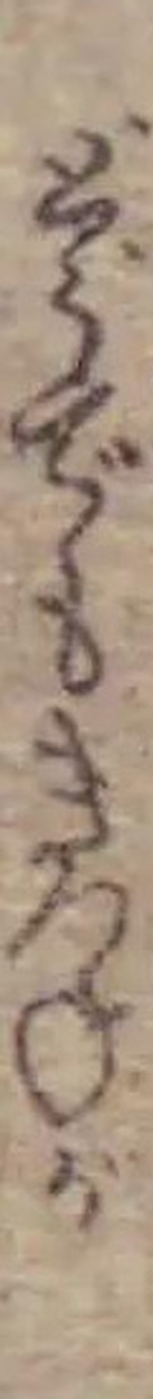どうでもきつねが
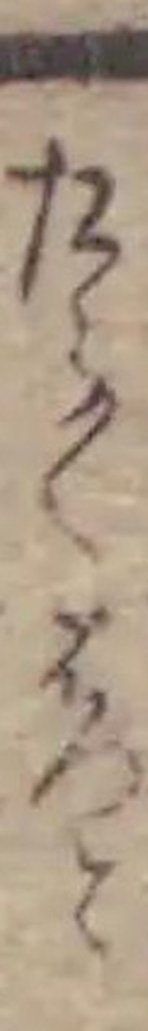たらくはつと
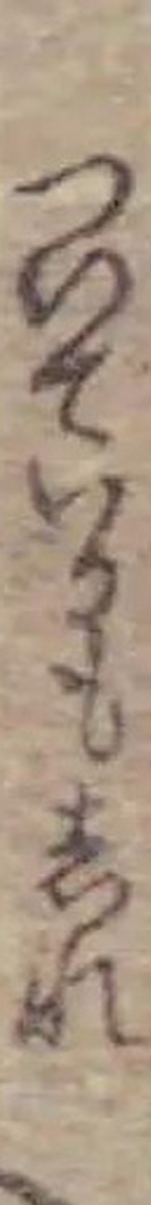ついているもしれ
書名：飛た間違矢口噂 2巻
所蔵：国立国会図書館 National Diet Library, JAPAN
